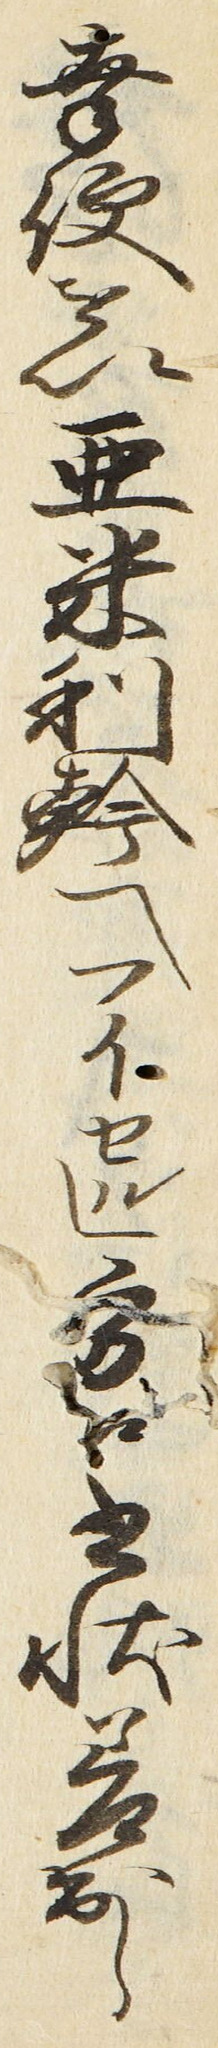幸便を以亜米利幹「フイセル」方江書状差出し
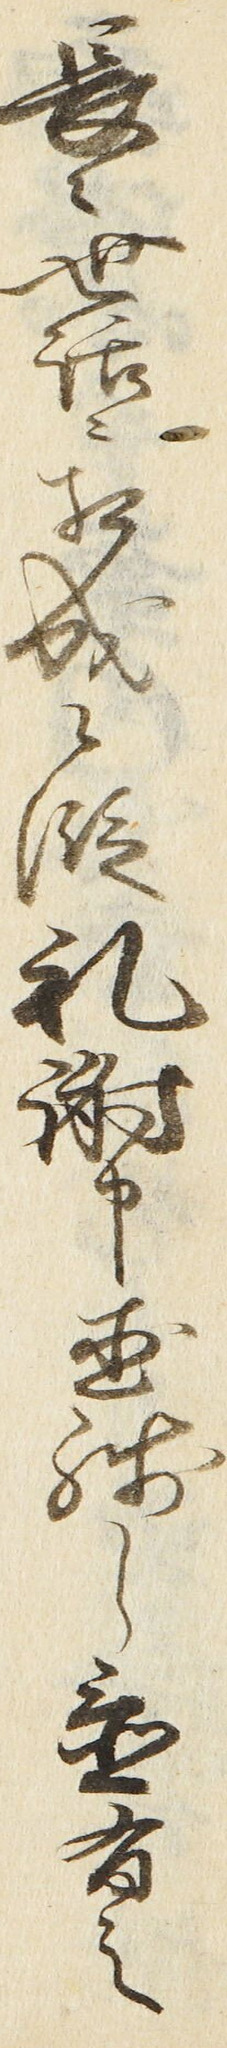長々世話ニ相成候段礼謝申置残し置有之
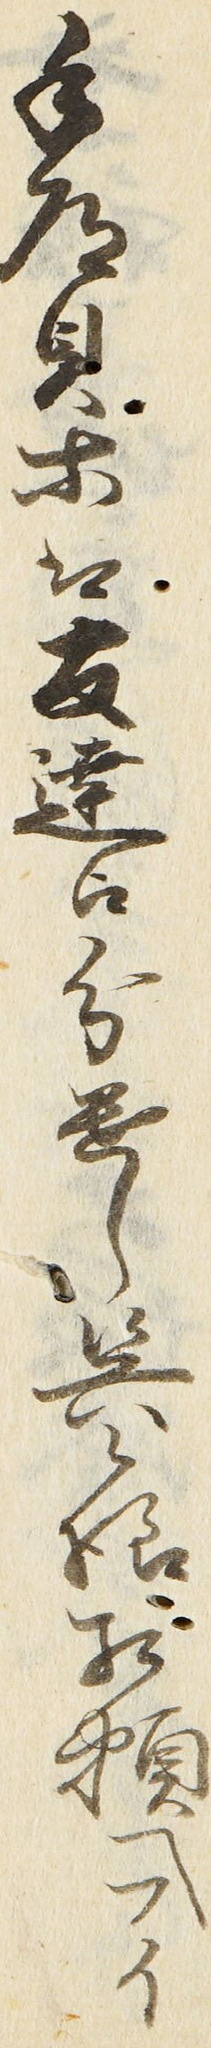手道貝等は友達江分遣し呉候様相頼「フイ
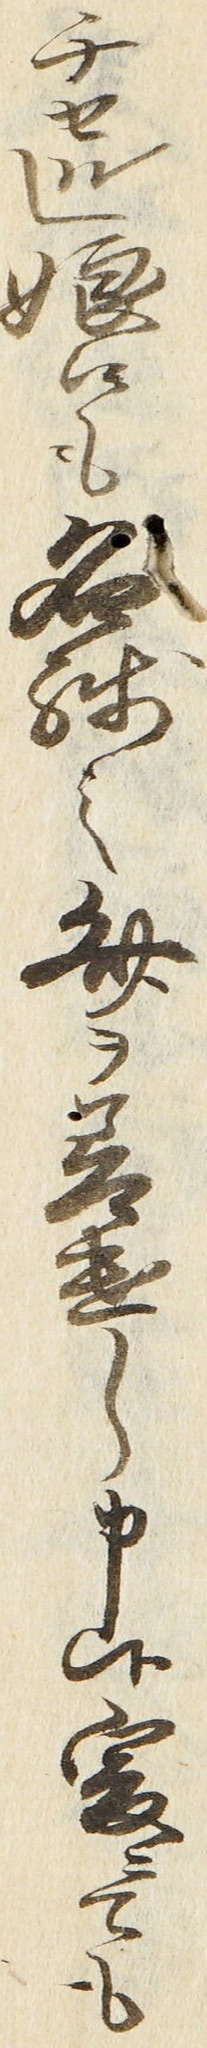チセル」娘江も名残之文ヲ差遣し申候爰ニても
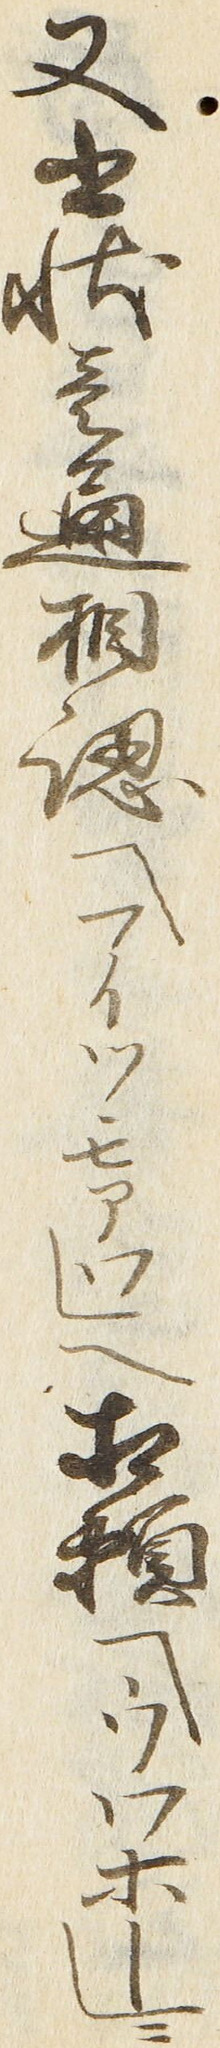又書状壱通相認「フイツモアワ」へ相頼「ウワホー」ニ
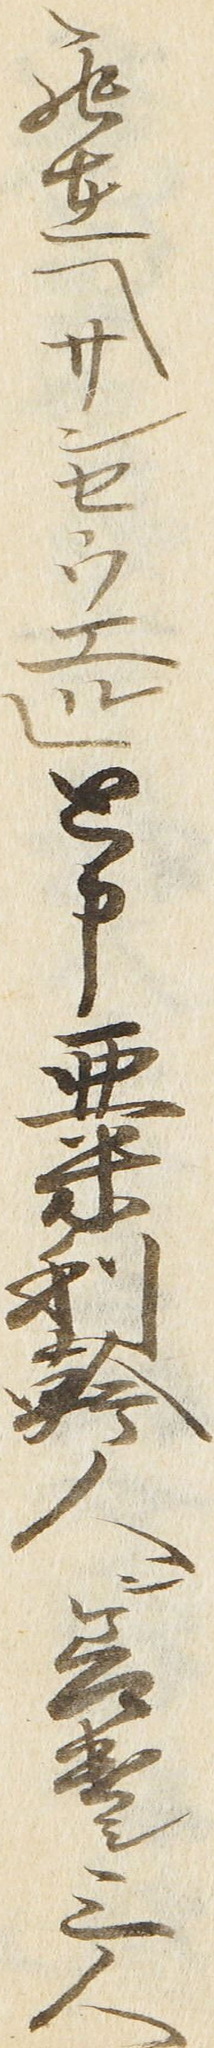罷在「サンセウエル」と申亜米利幹人ニ差遣シ三人
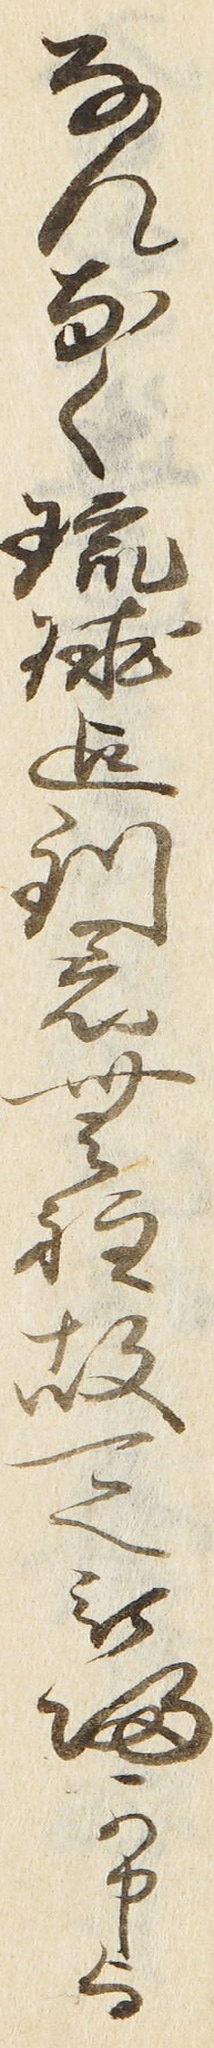なんなく琉球迄到着無程故郷へ被帰可申と
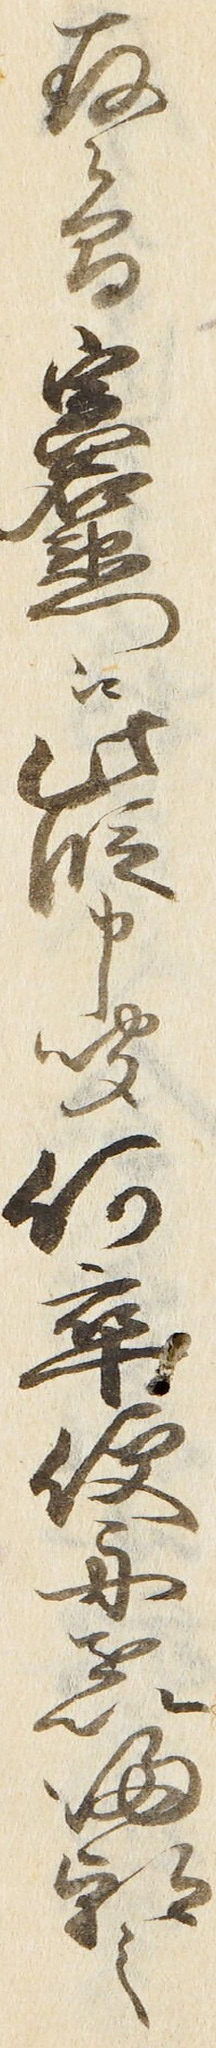存候間寅右衛門江此段申聞何卒便舟を以帰朝之
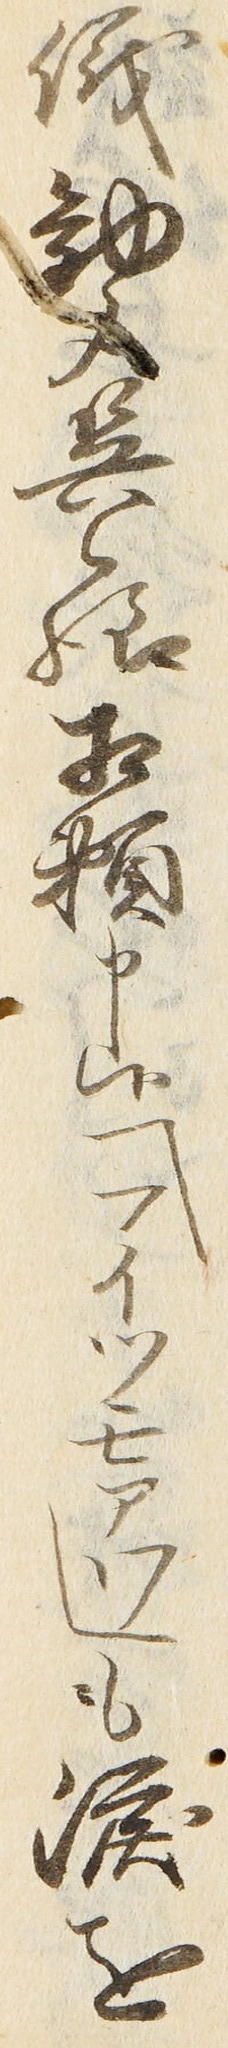儀勧メ呉候様相頼申候「フイツモアワ」も涙を
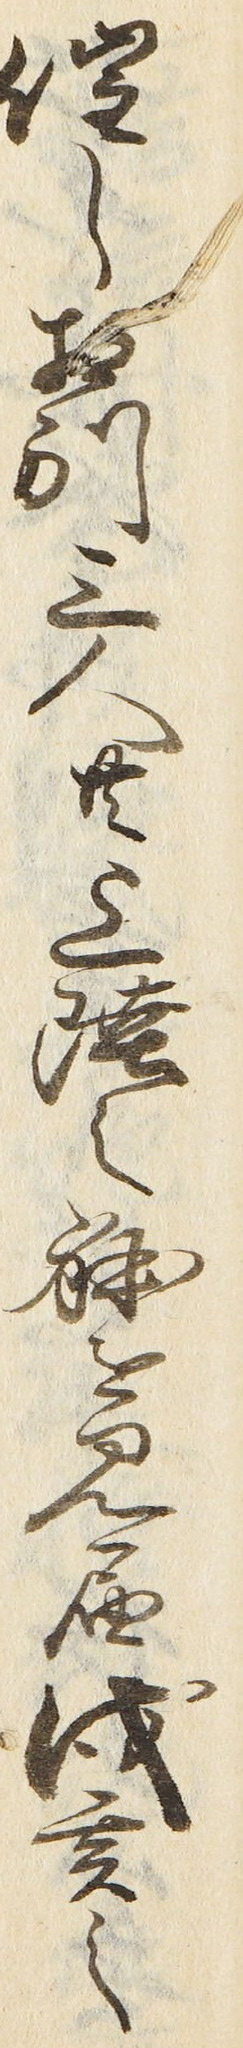催し相別三人共上陸之躰を見届戌亥之
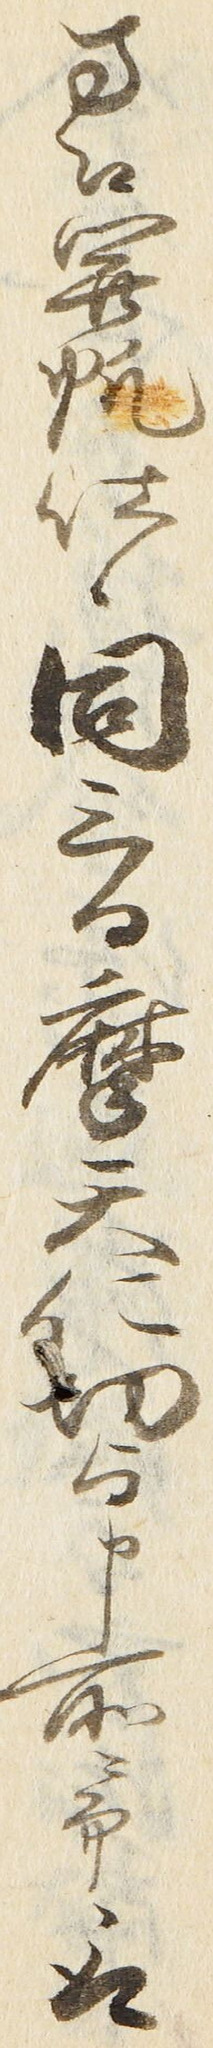方開帆仕候同三日摩天仁切と申所ニ而取
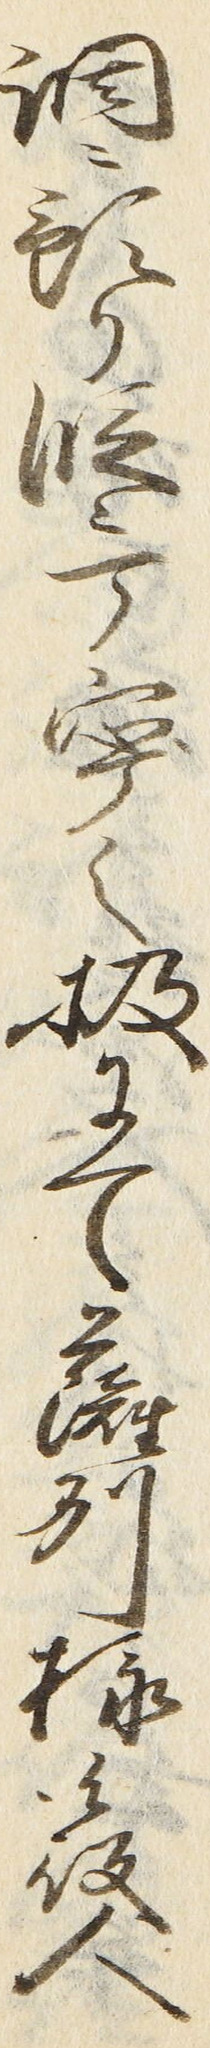調ニ預り段々丁寧之扱にて薩州様御役人
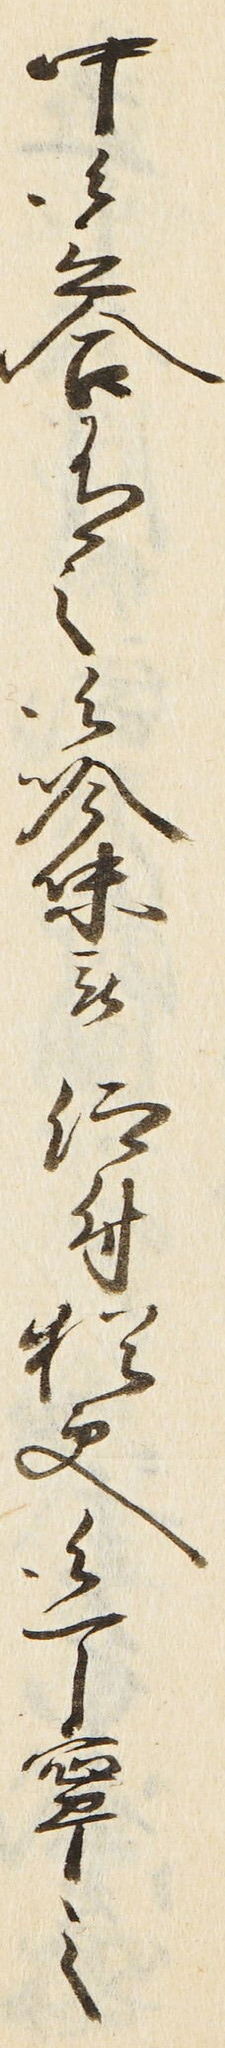中御立合有之御吟味被仰付猶更御丁寧之
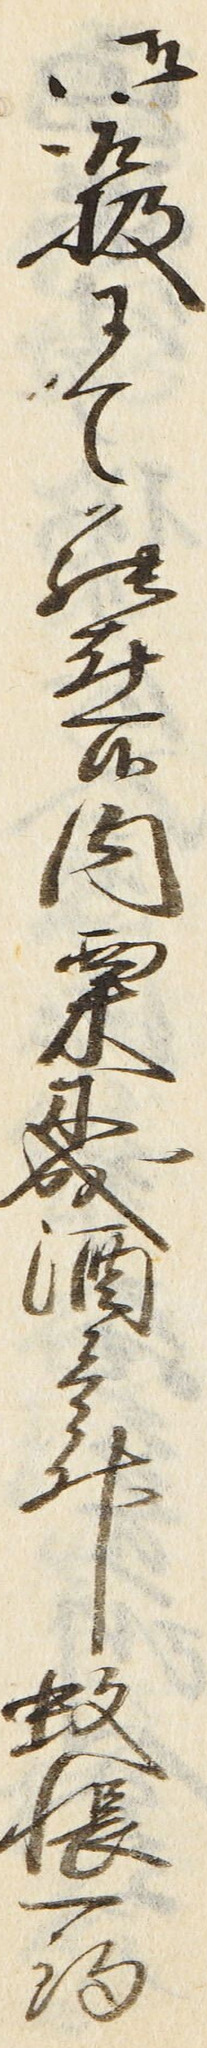御取扱にて罷在候内粟森酒壱升蚊帳一釣
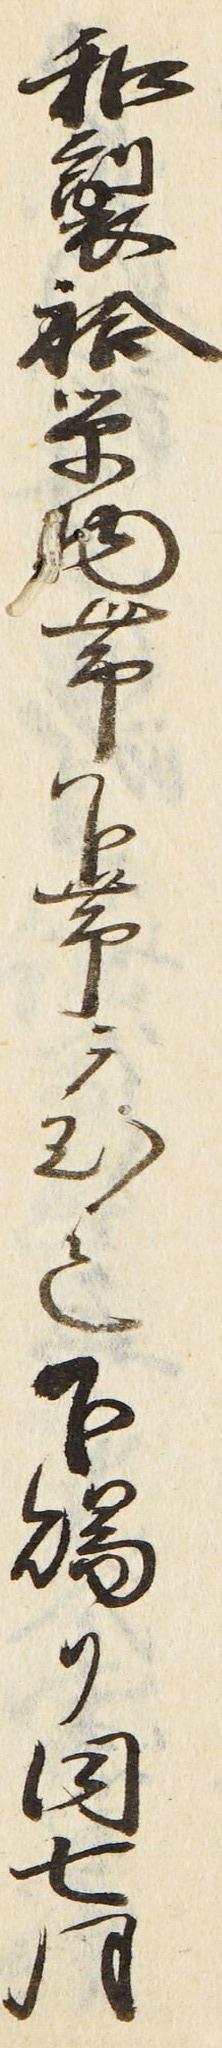和製袷単物帯下帯ニ到迄下賜り同七月
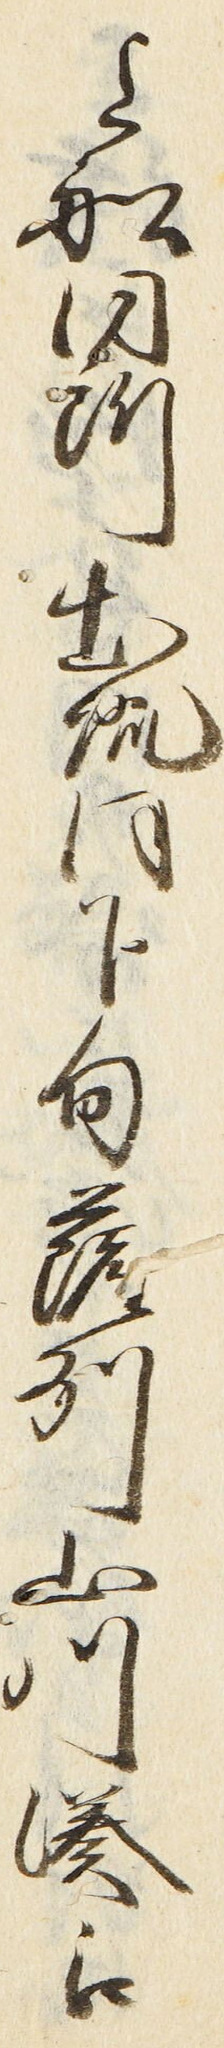上船同所出帆同下旬薩州山川湊江
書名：漂客談寄
